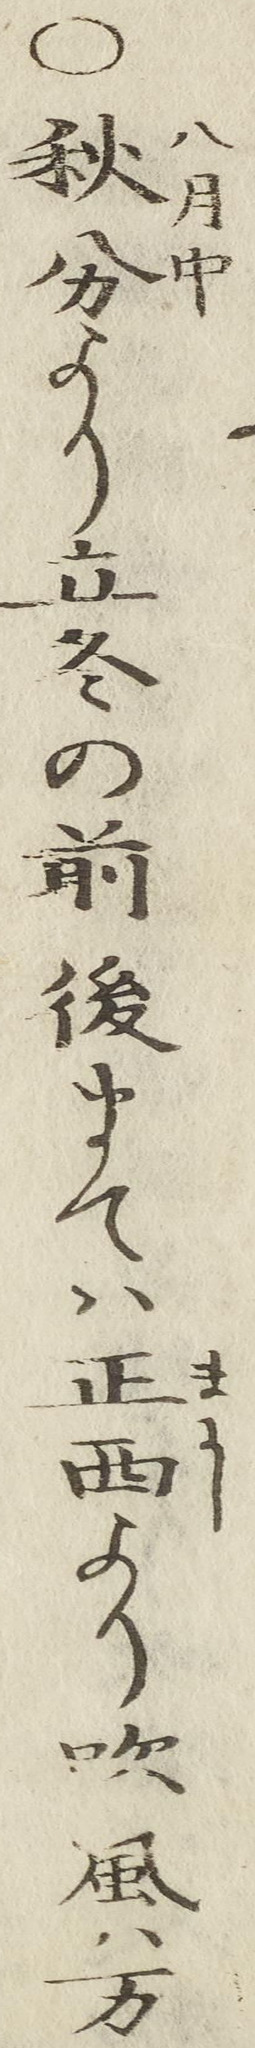〇秋分より立冬の前後まては正西より吹風は万
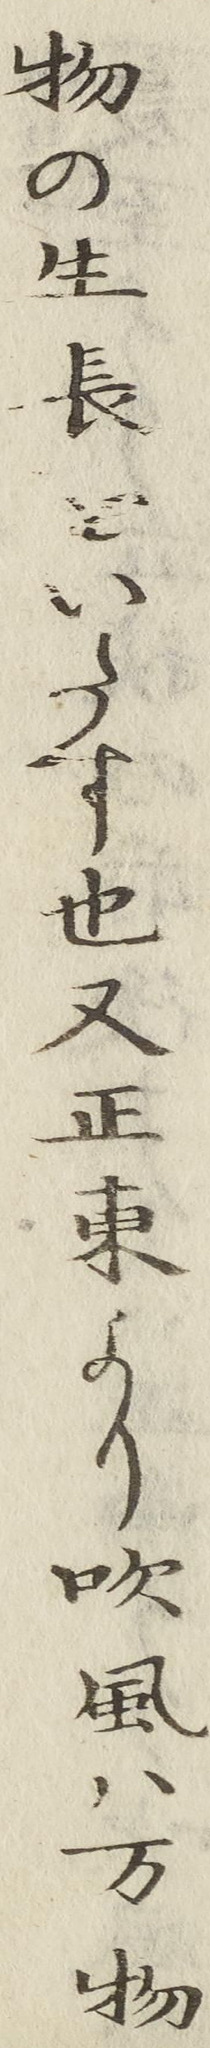物の生長をいたす也又正東より吹風は万物
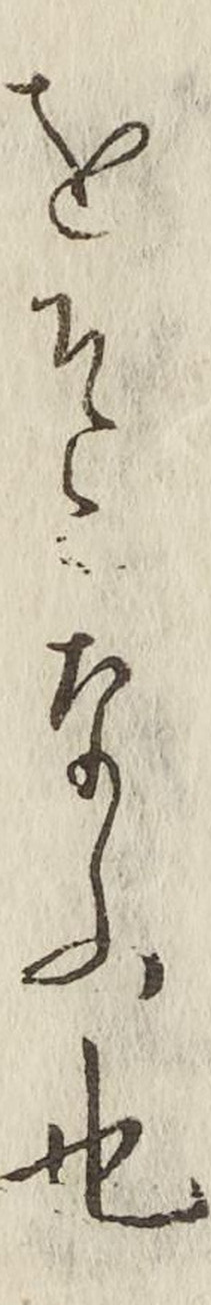をそこなふ也
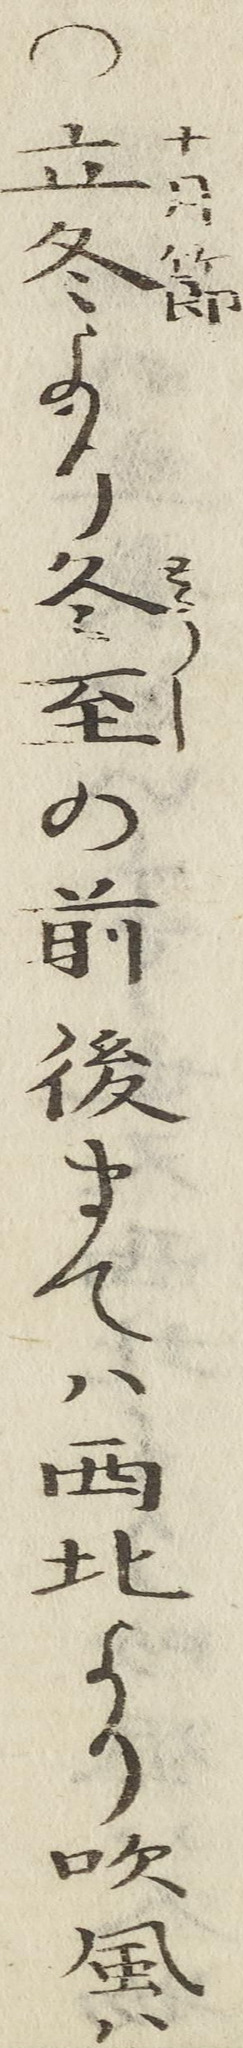〇立冬より冬至の前後まては西北より吹風は
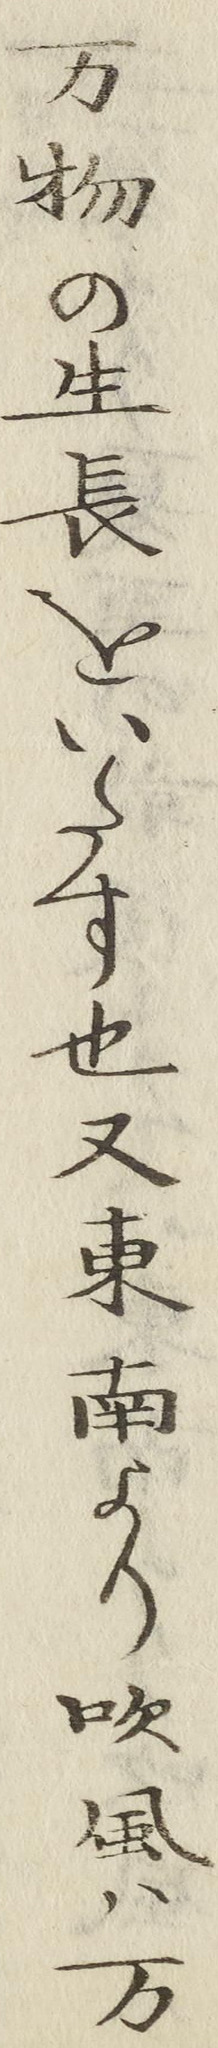万物の生長をいたす也又東南より吹風は万
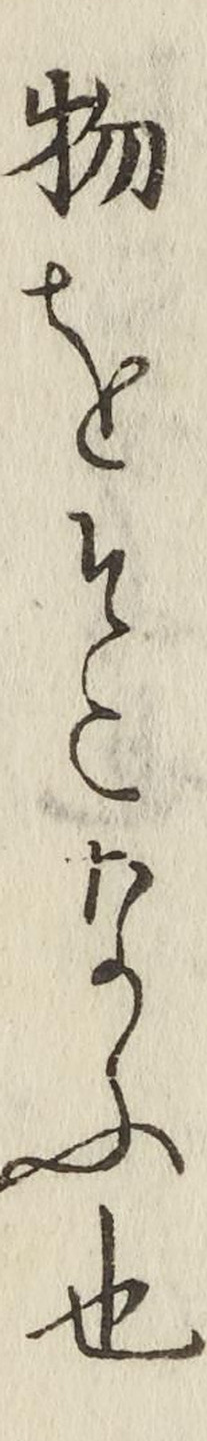物をそこなふ也
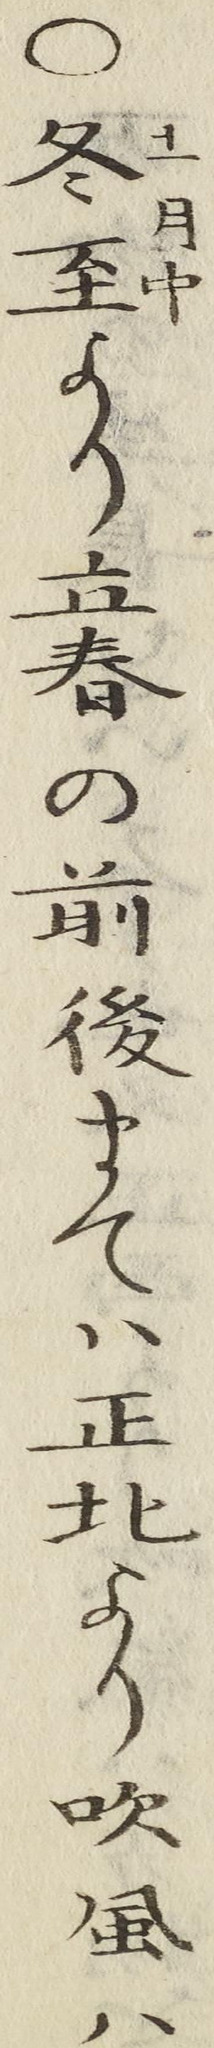〇冬至より立春の前後まては正北より吹風は
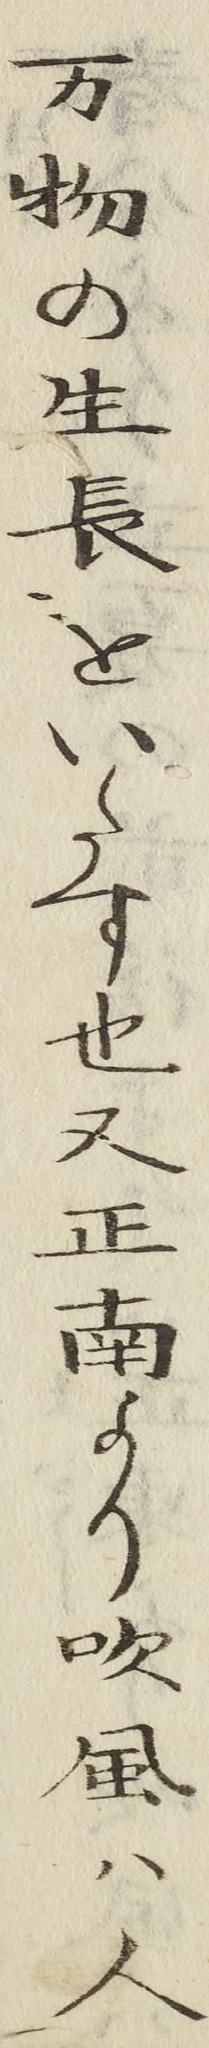万物の生長をいたす也又正南より吹風は人
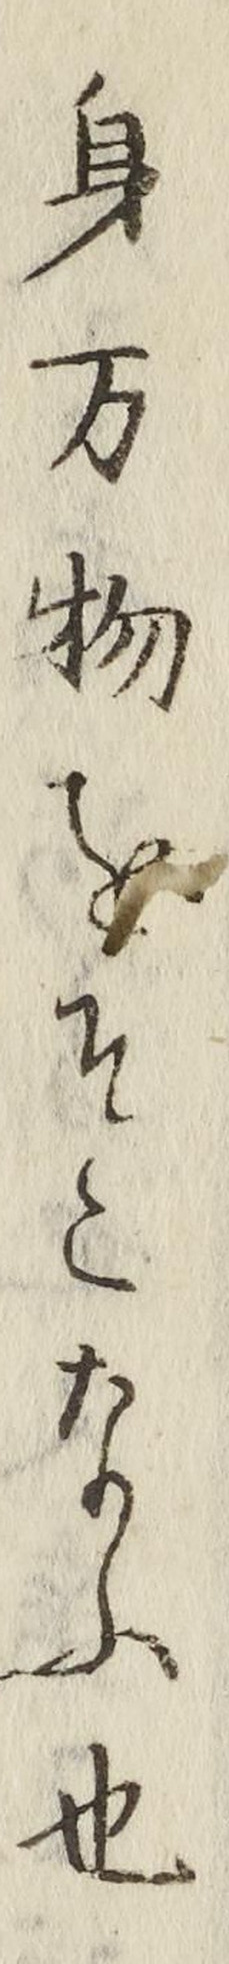身万物をそこなふ也
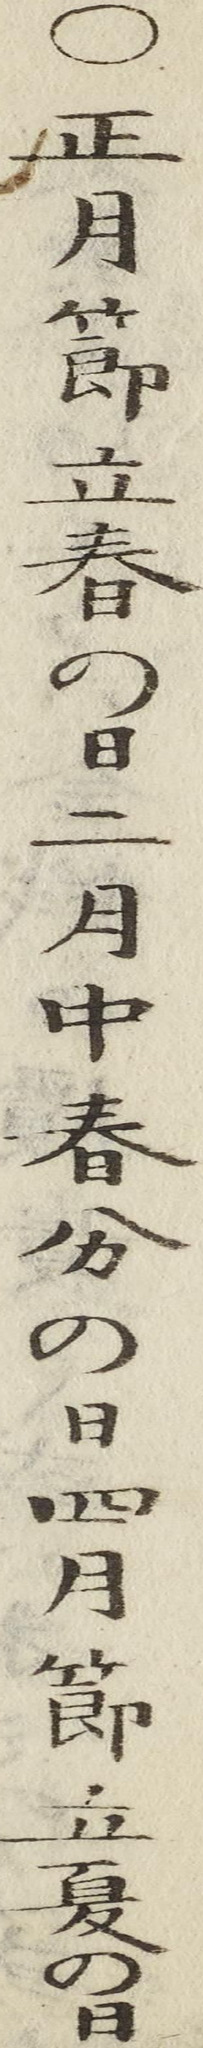〇正月節立春の日二月中春分の日四月節立夏の日
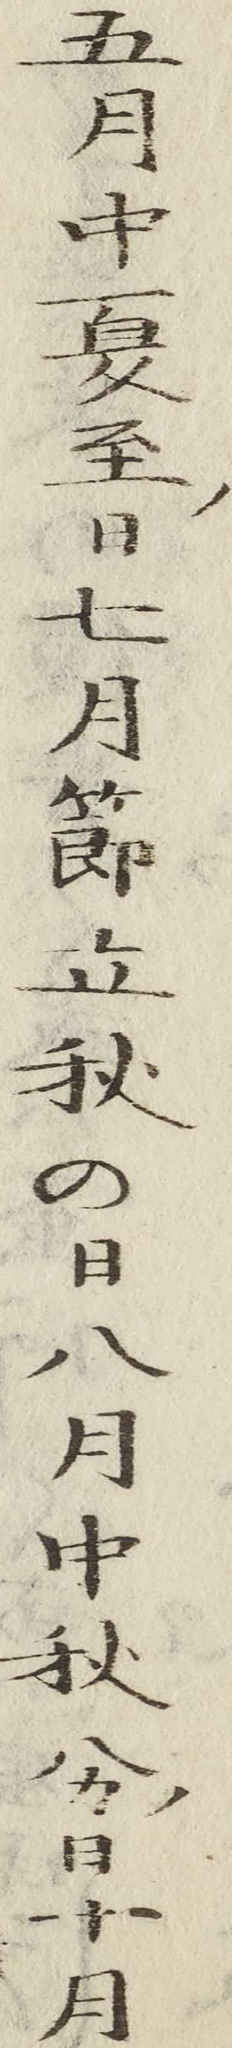五月中夏至ノ日七月節立秋の日八月中秋分ノ日十月
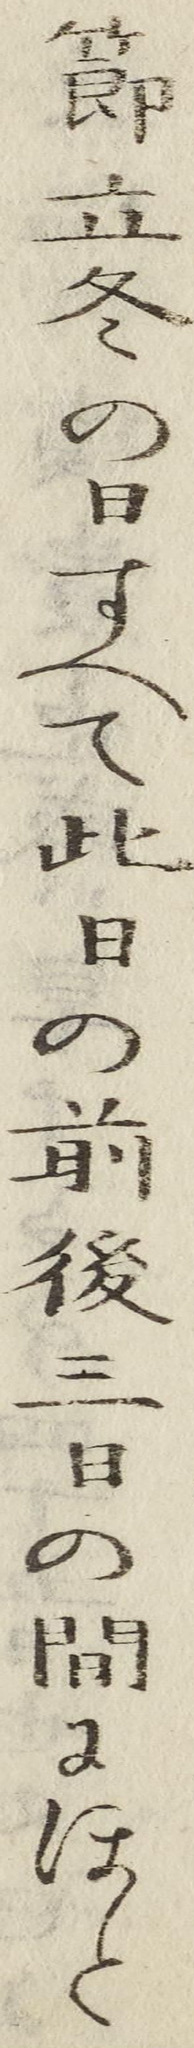節立冬の日すへて此日の前後三日の間にほと
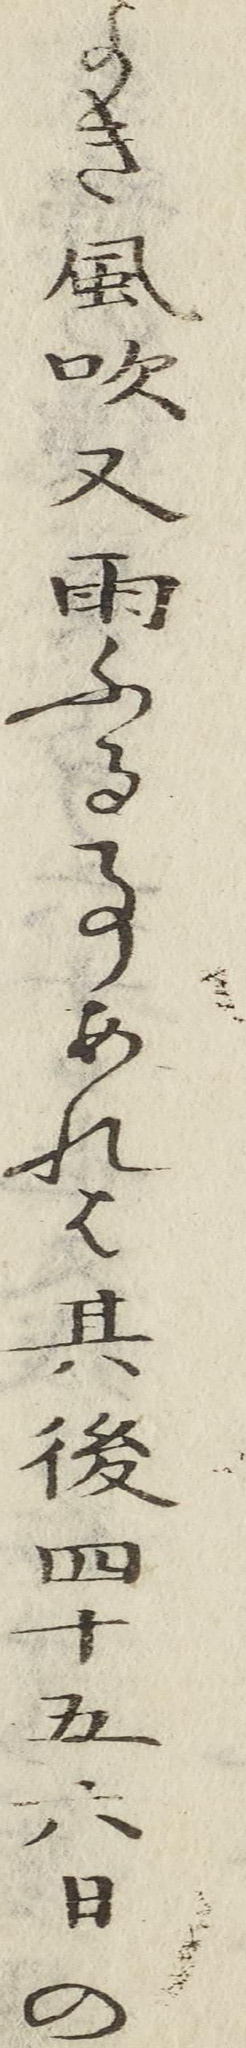よき風吹又雨ふる事あれは其後四十五六日の
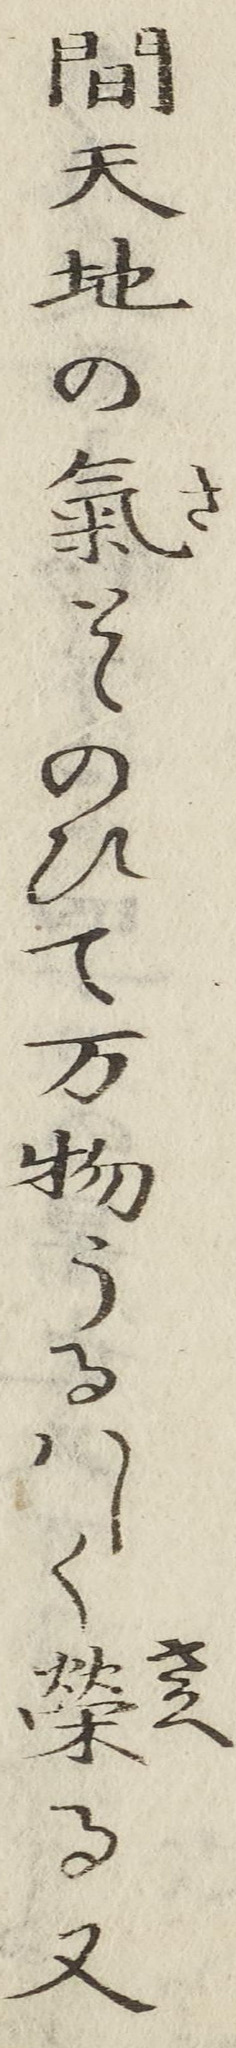間天地の気とゝのひて万物うるはしく栄る又
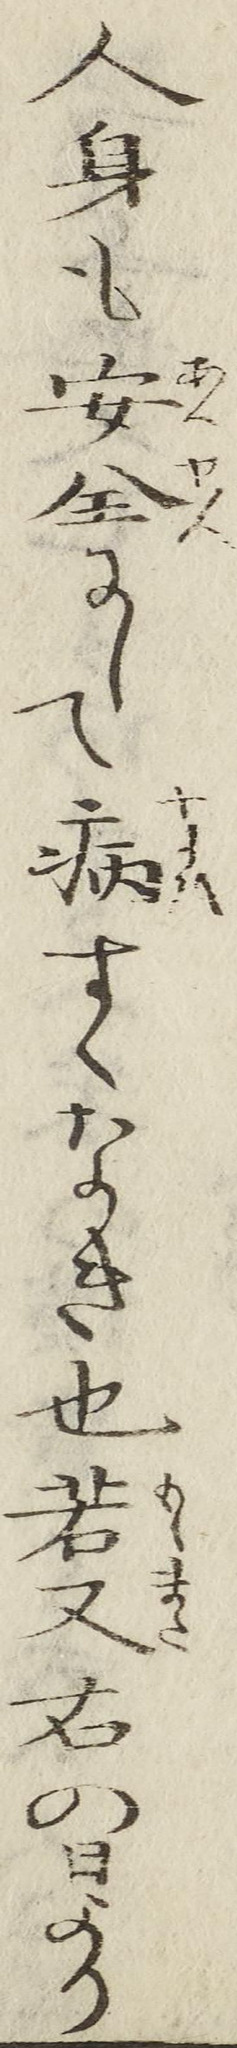人身も安全にして病すくなき也若又右の日より
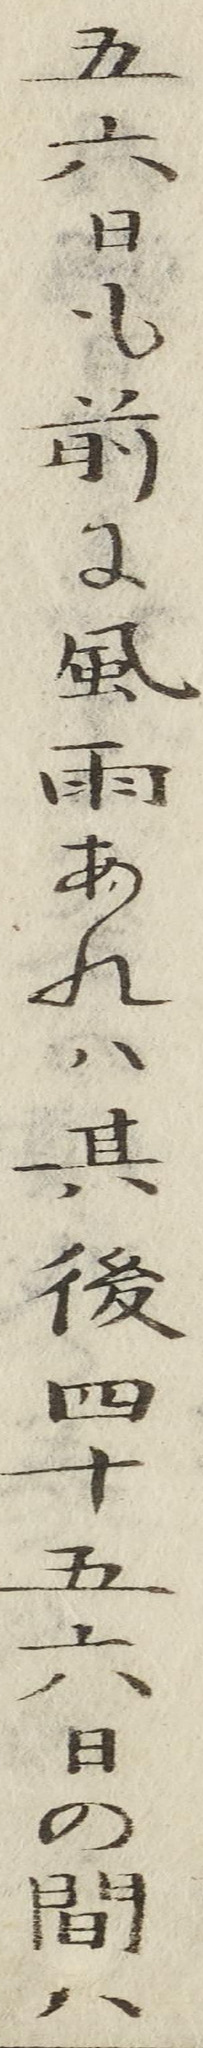五六日も前に風雨あれは其後四十五六日の間は
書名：天時占候　二
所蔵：東京大学地震研究所図書室 Earthquake Research Institute Library, The University of Tokyo, JAPAN
